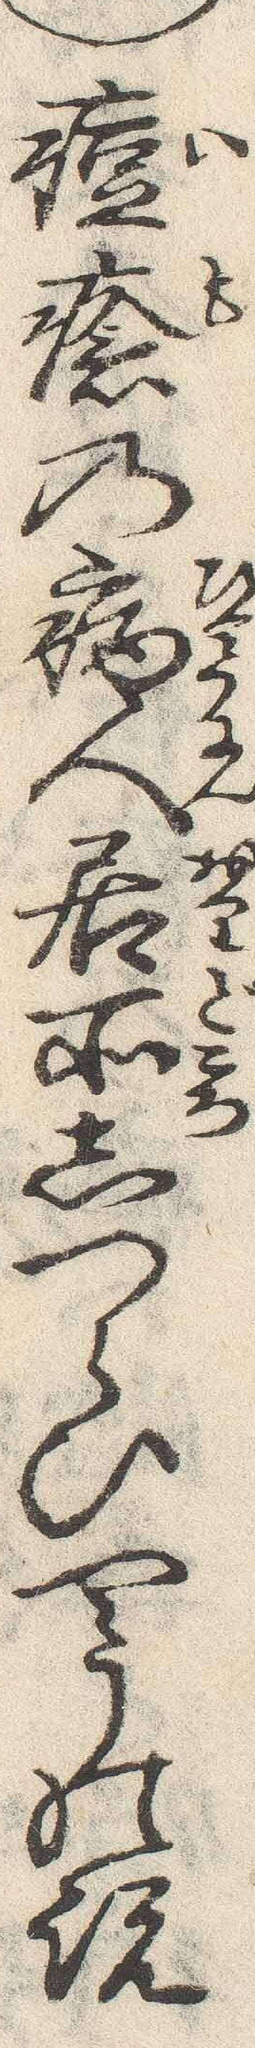㊃痘瘡の病人居所しつらひやうの説
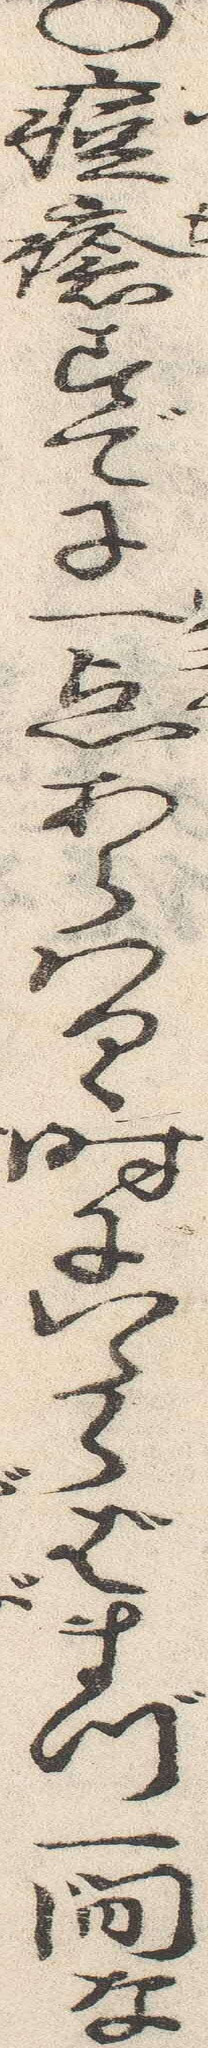○痘瘡すでに一点あらはるゝ時にいたらばまづ一間な
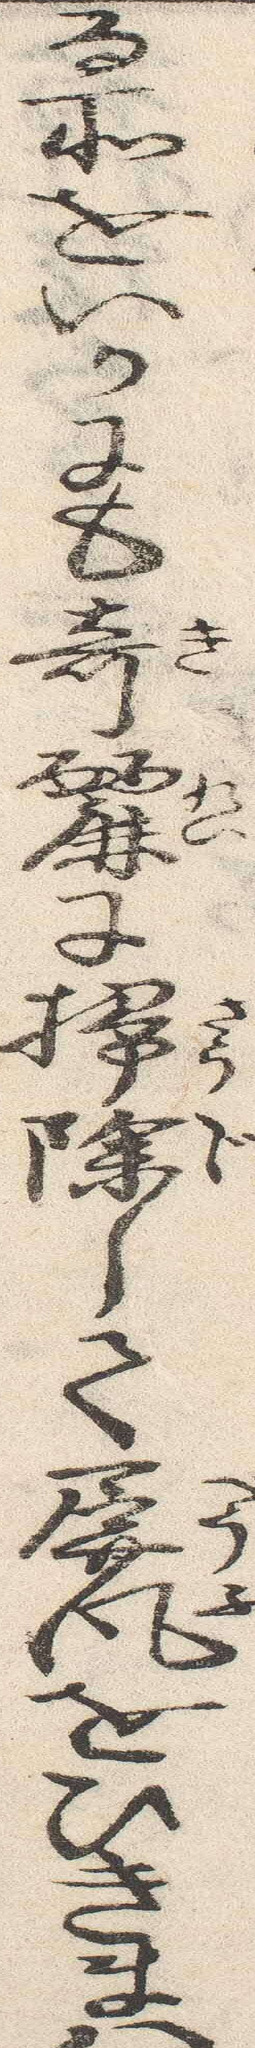る所をいかにも奇麗に掃除して屏風をひきまは
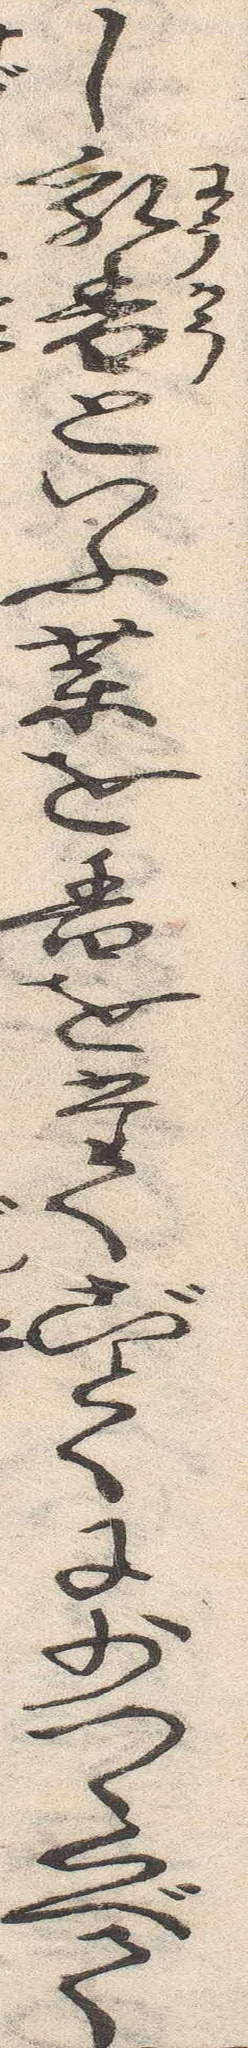し乳香といふ薬を香をたくごとくに少つゝくべて
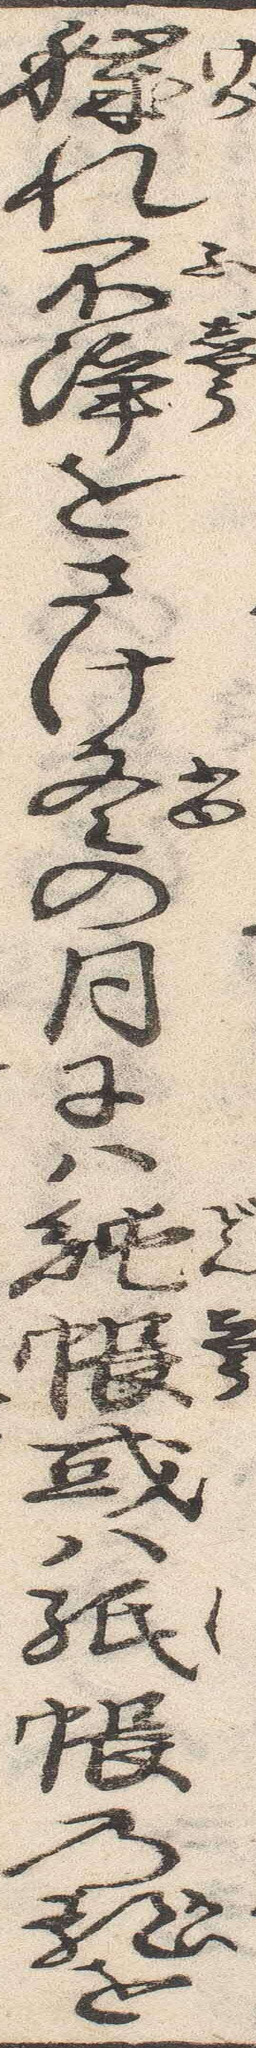穢れ不浄をさけ冬の月には純帳或は紙帳の類を
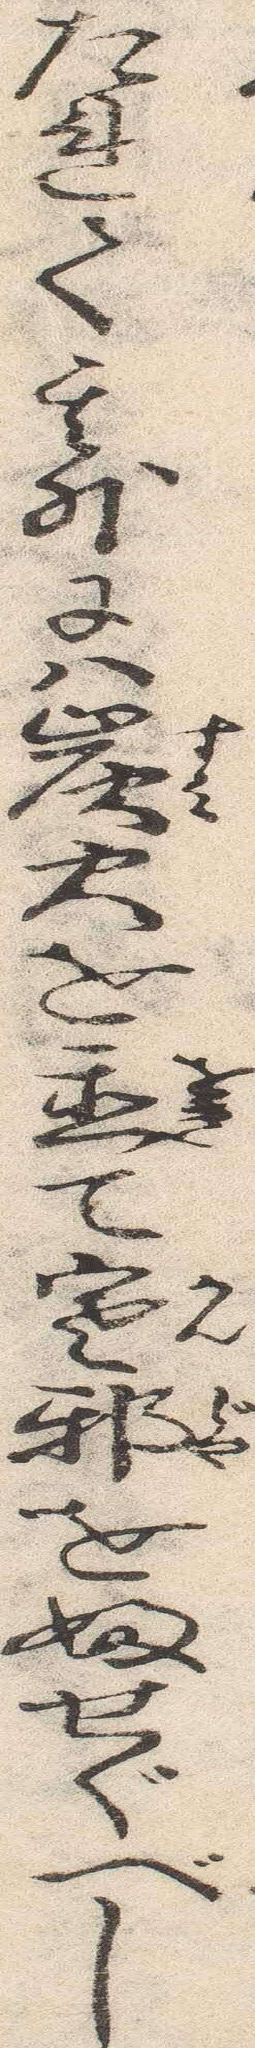たれて其外には炭火を置て寒邪をふせぐべし
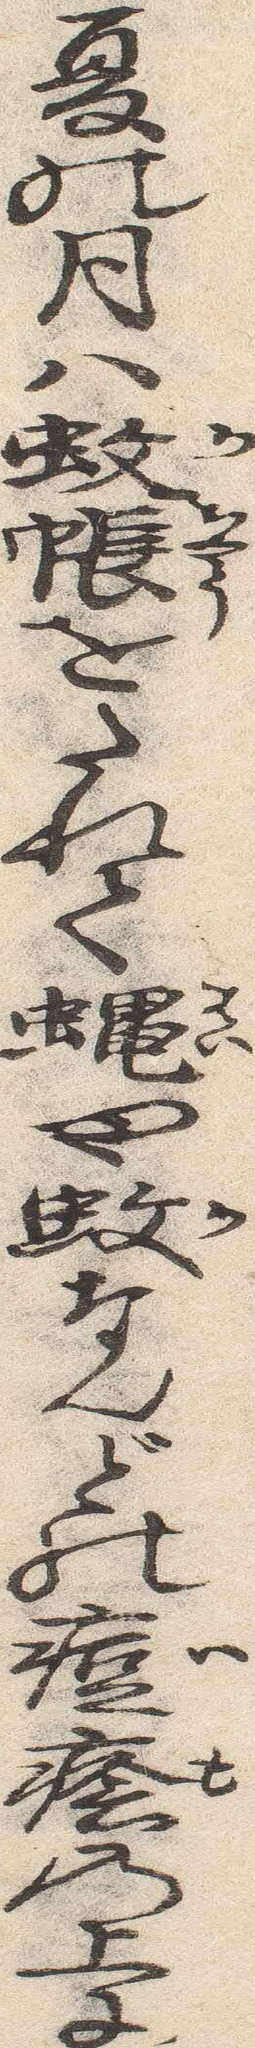夏の月は蚊帳をたれて蝿や蚊なんどの痘瘡の上に
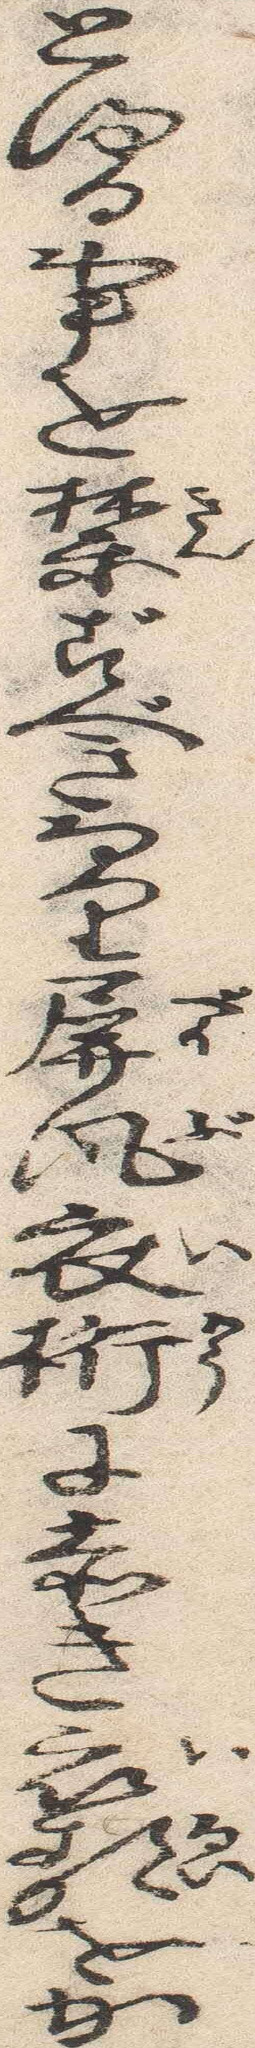とまる事を禁ずべきなり屏風衣桁に赤き衣類をか
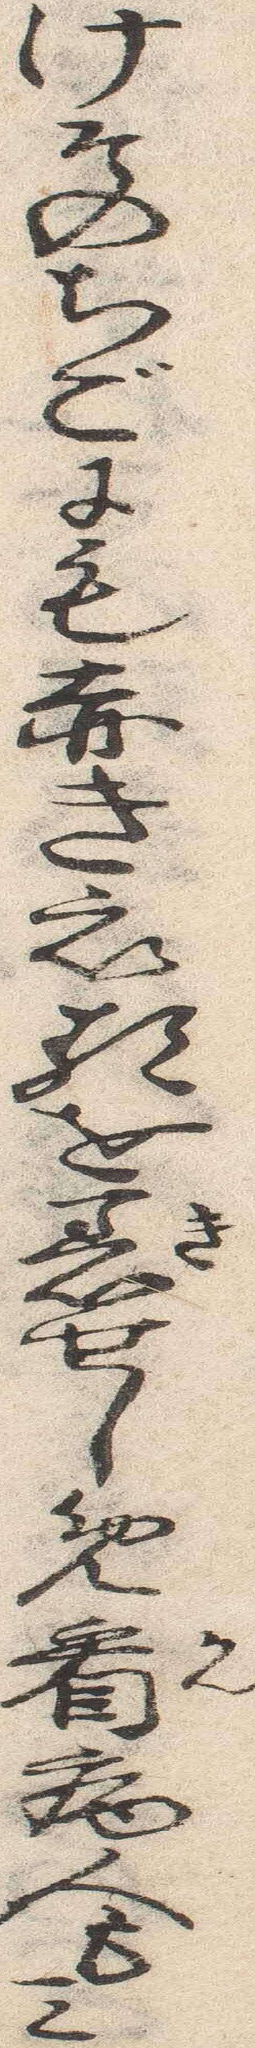かそのちごにも赤き衣類を着せしめ看病人もみ
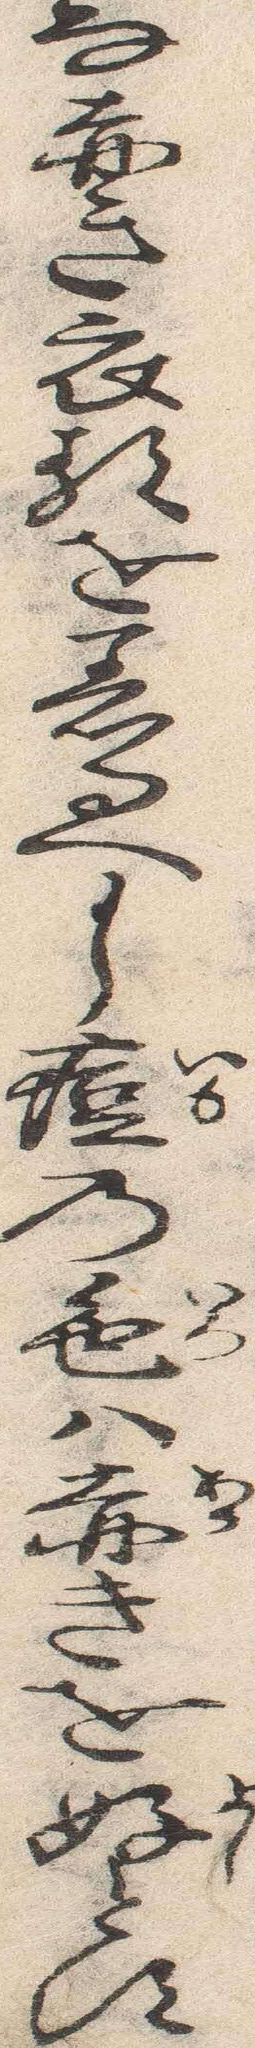な赤き衣類を着るへし痘の色は赤きを好とす
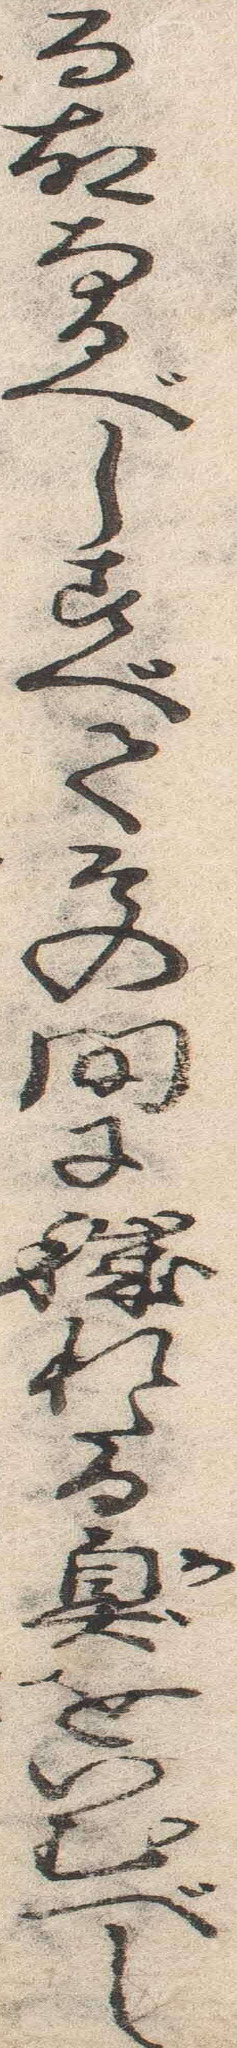る故なるべしすべてその間に穢れたる臭をいむべし
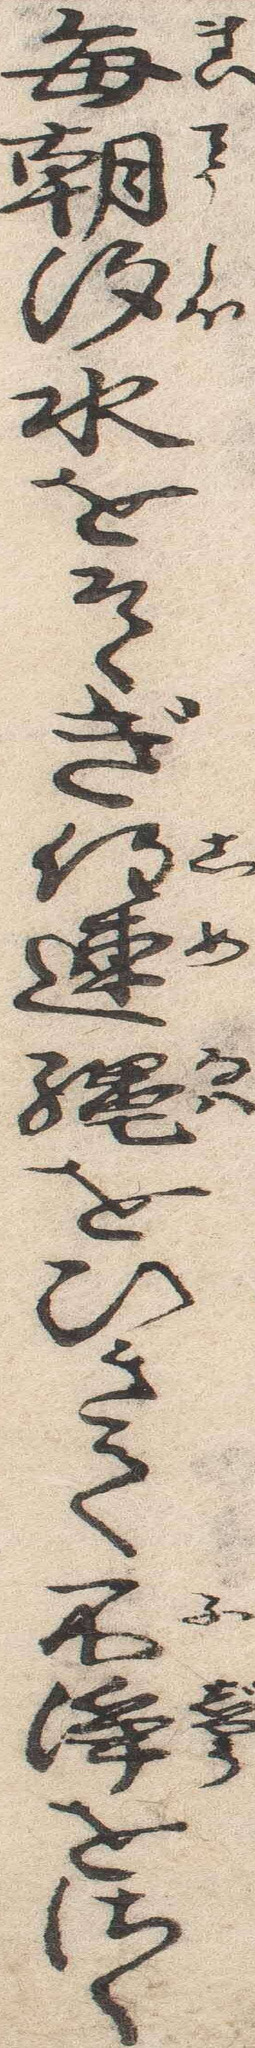毎朝汐水をそゝぎ注連縄をひきて不浄をさく
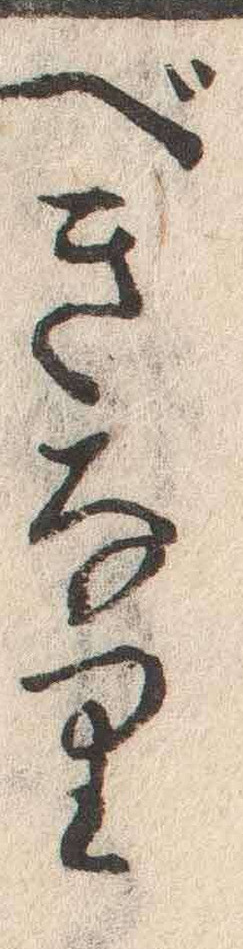べきなり
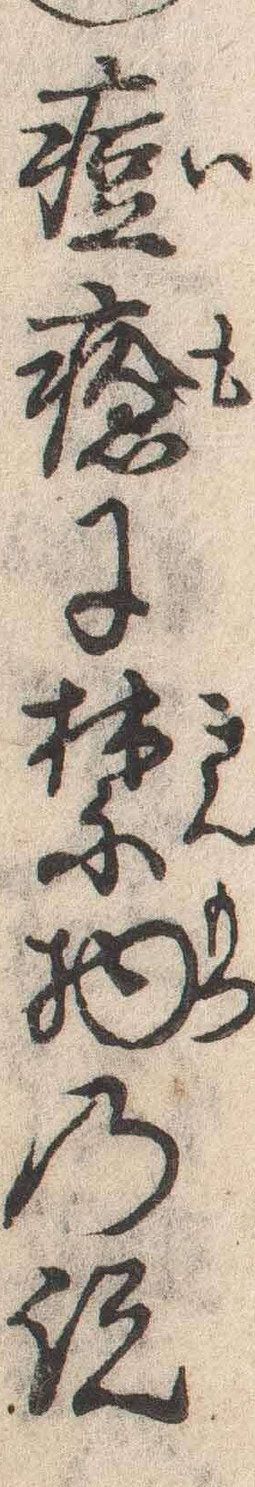㊄痘瘡に禁物の説

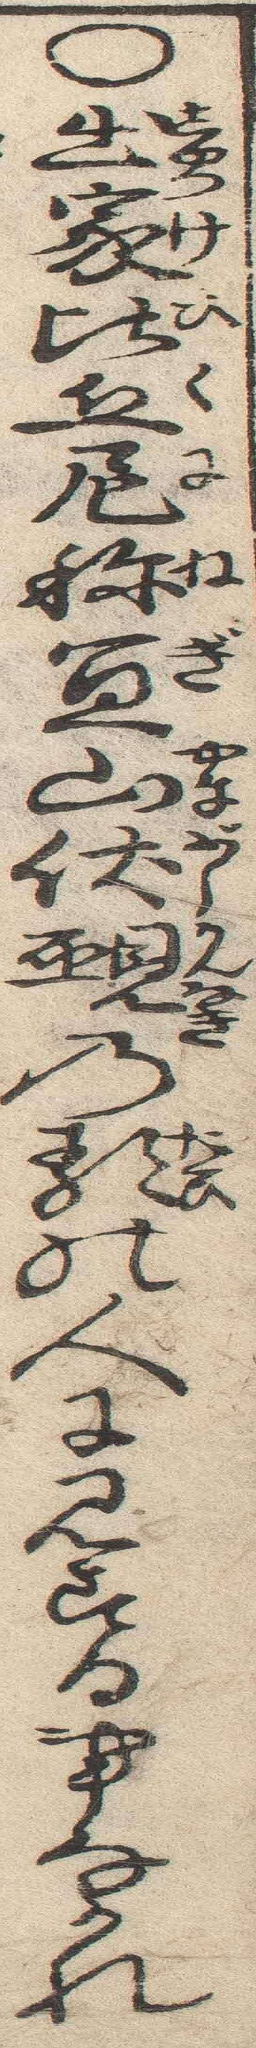○出家比丘尼祢宜山伏覡の類の人に見する事なかれ
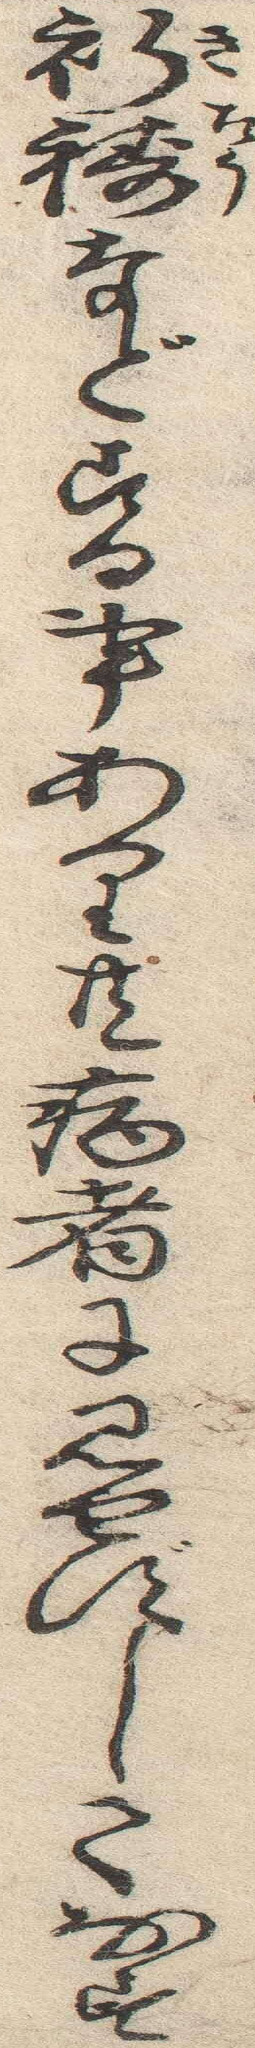祈祷などする事あり共病者に見せずしてなす
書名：小児必用養育草
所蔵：東京学芸大学附属図書館 国文学研究資料館
